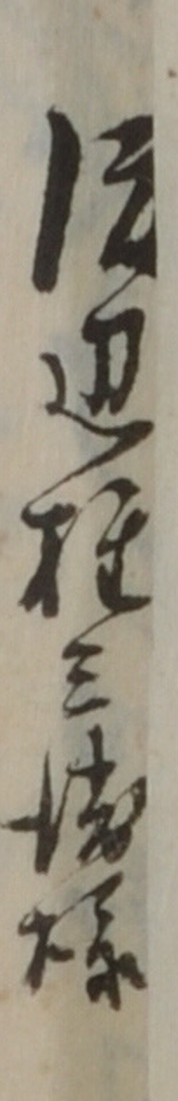渡辺権兵衛様
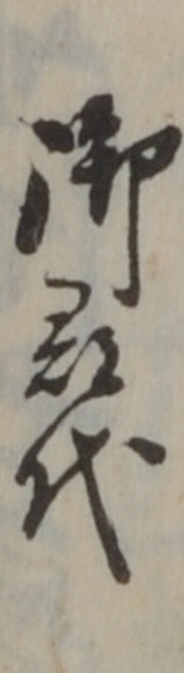御郡代
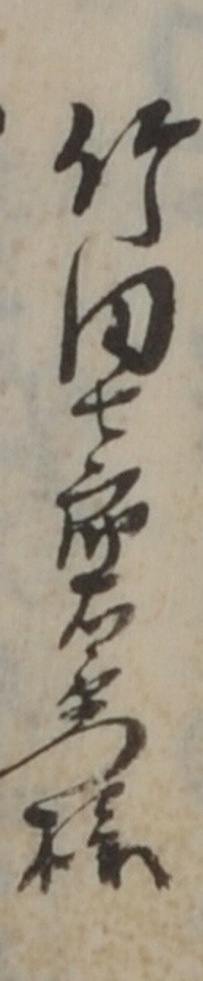竹田七郎右衛門様
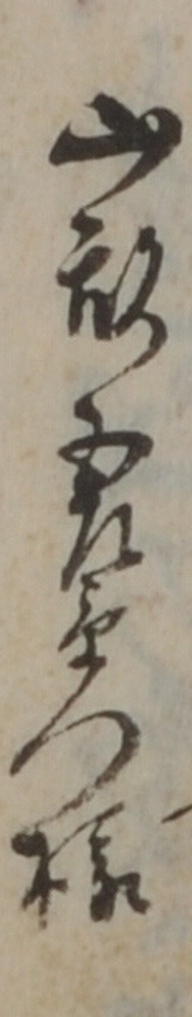山形五左衛門様
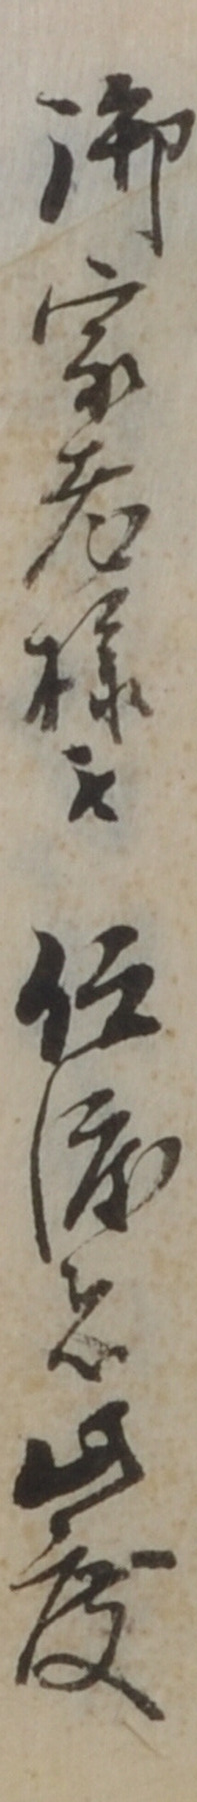御家老様被仰渡者此度

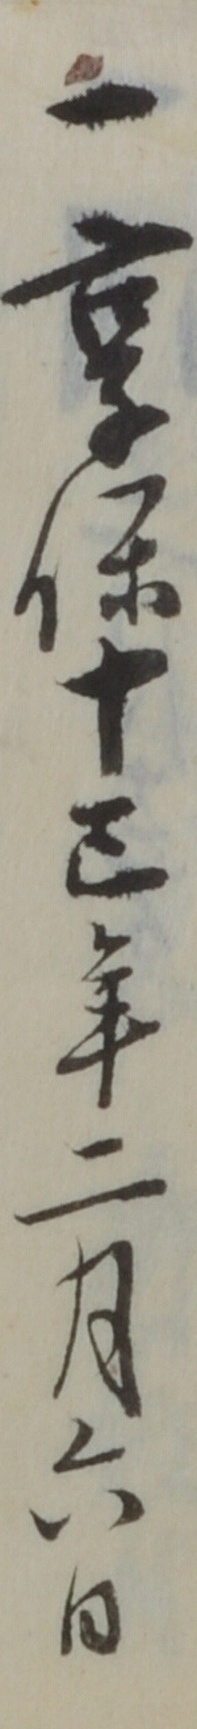一享保十巳年二月六日
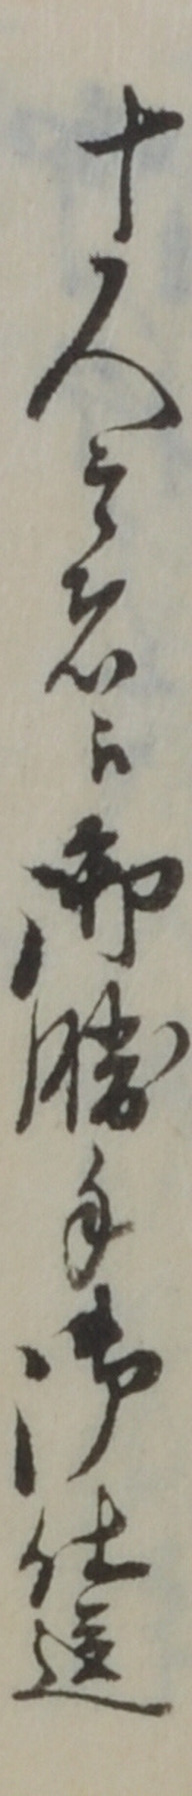十人之者江御勝手御仕送
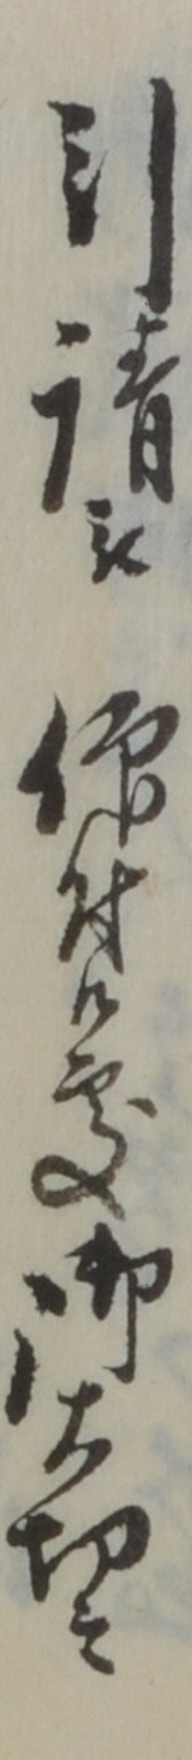引請被仰付候処御大切之
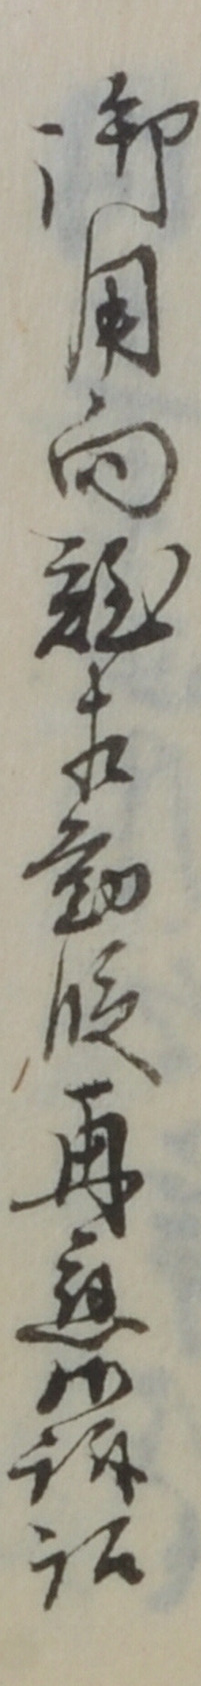御用向難相勤段再応御訴訟
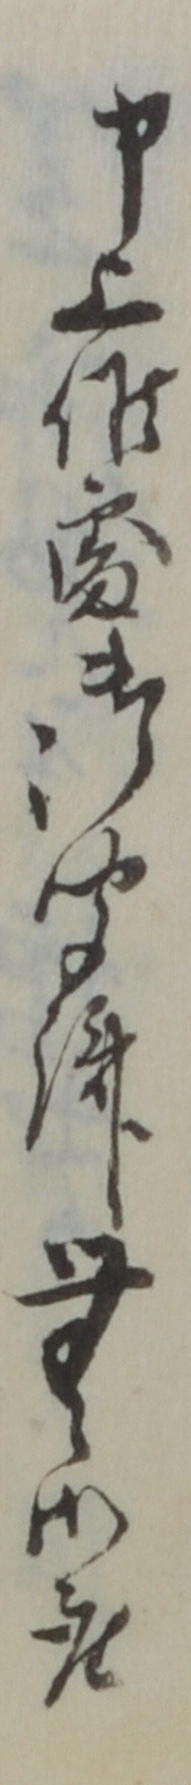申上候処御聞済無御座
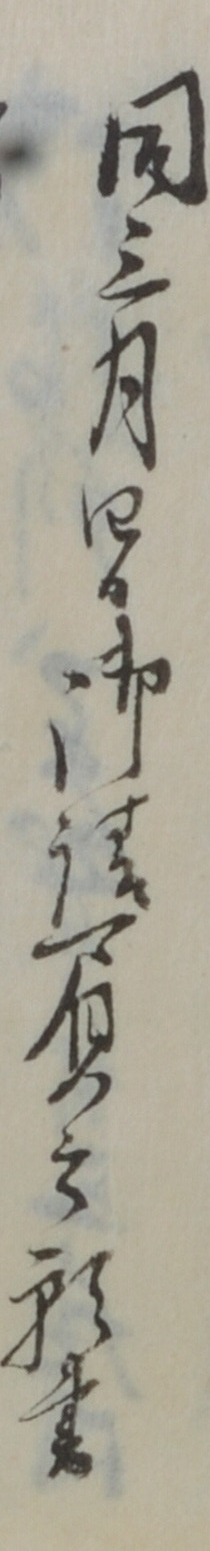同三月四日御請負之願書
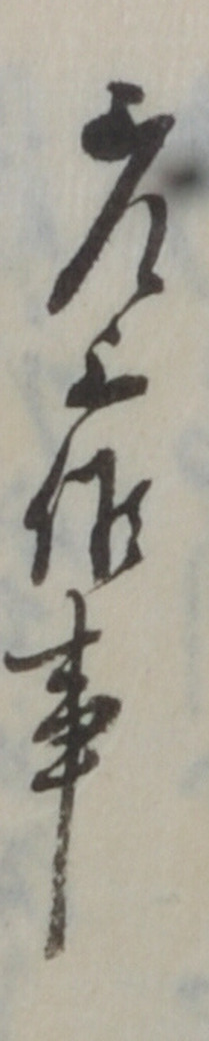差上候事

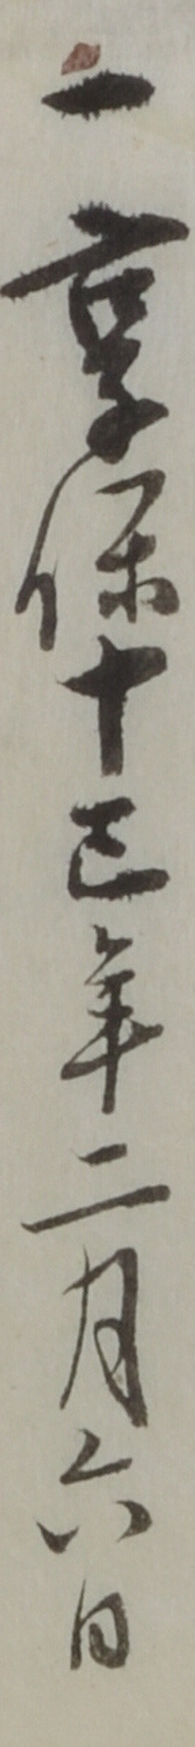一享保十巳年二月六日
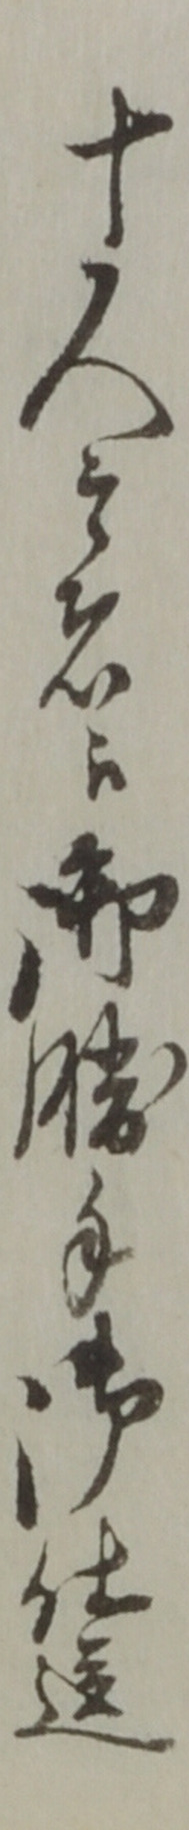十人之者江御勝手御仕送
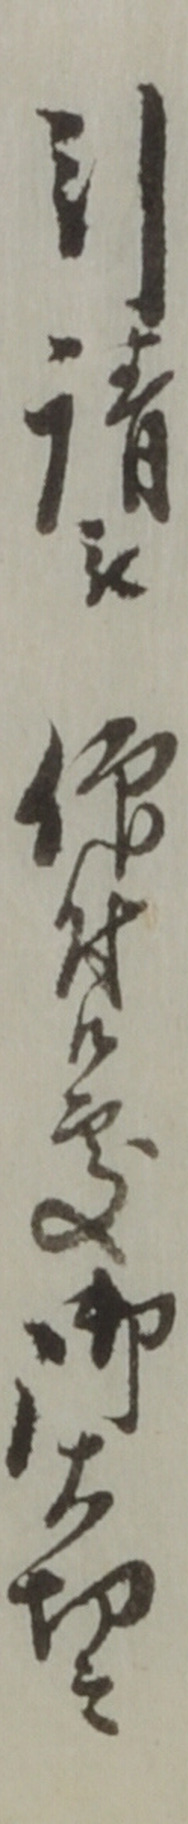引請被仰付候処御大切之
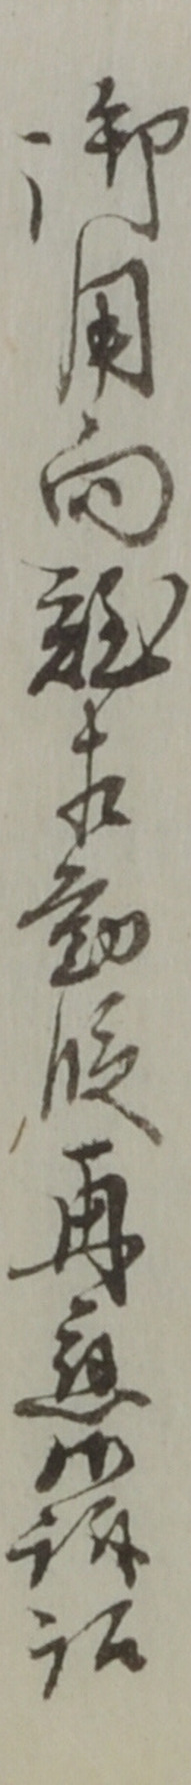御用向難相勤段再応御訴訟
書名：抜書
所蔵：伊那市立高遠町図書館・合同会社AMANE
